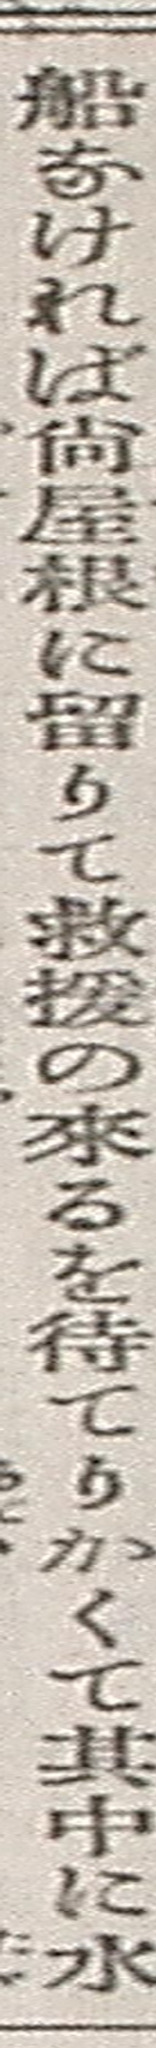船なければ尚屋根に留りて救援の来るを待てりかくて其中に水
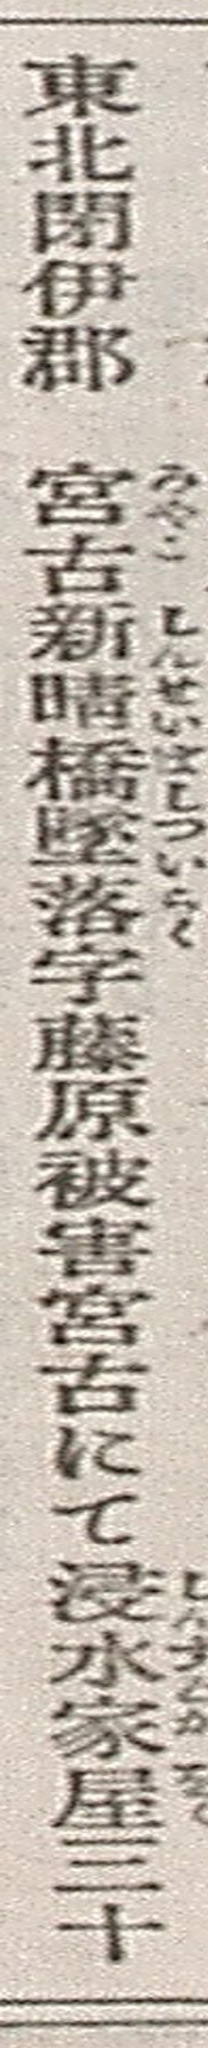東北閉伊郡宮古新晴橋墜落字藤原被害宮古にて浸水家屋三十
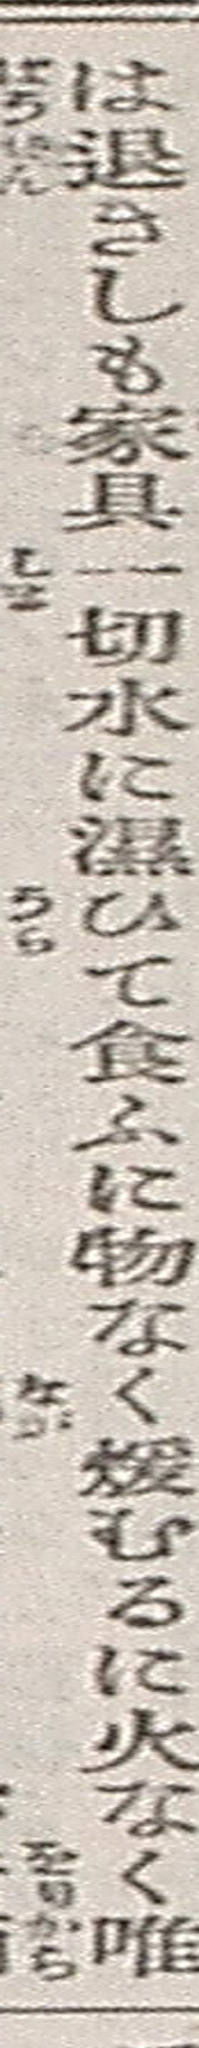は退きしも家具一切水に濕ひて食ふに物なく煖むるに火なく唯
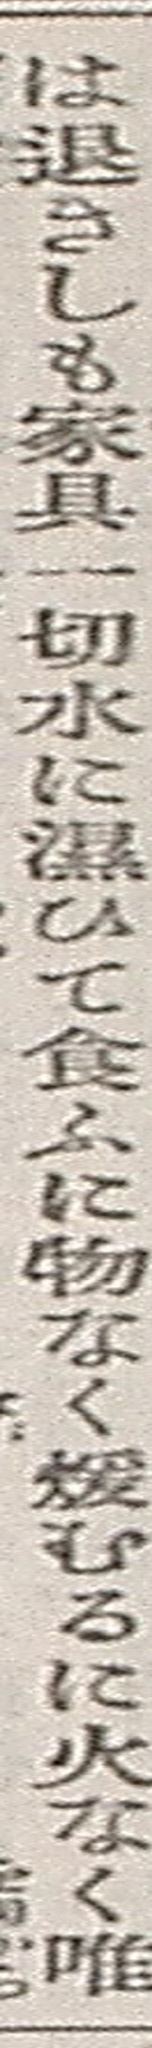は退きしも家具一切水に濕ひて食ふに物なく煖むるに火なく唯
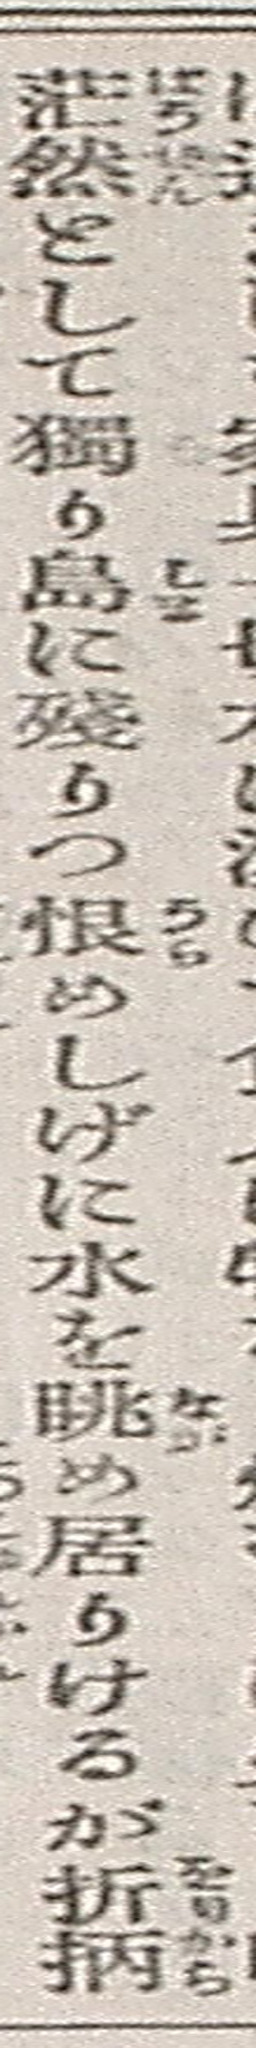茫然として独り島に残りつ恨めしげに水を眺め居りけるが折柄
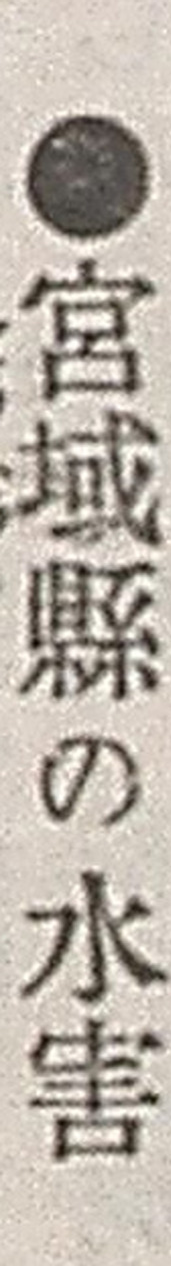●宮城県の水害
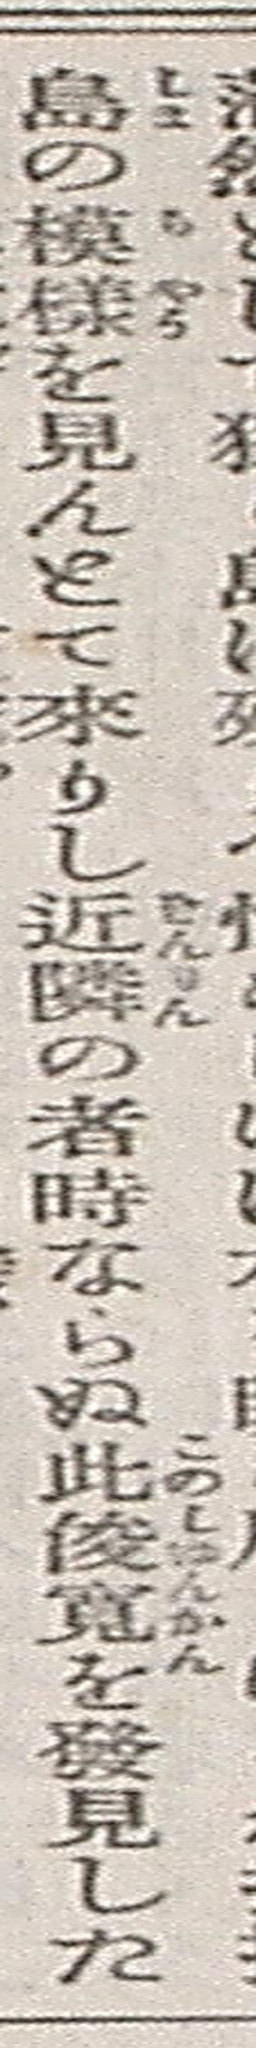島の模様を見んとて来りし近隣の者時ならぬ此俊寛を発見した
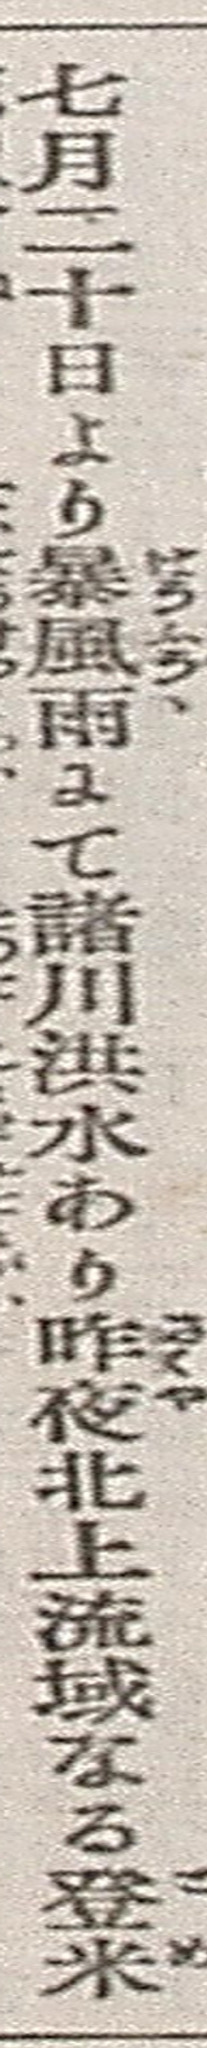七月二十日より暴風雨にて諸川洪水あり昨夜北上流域なる登米
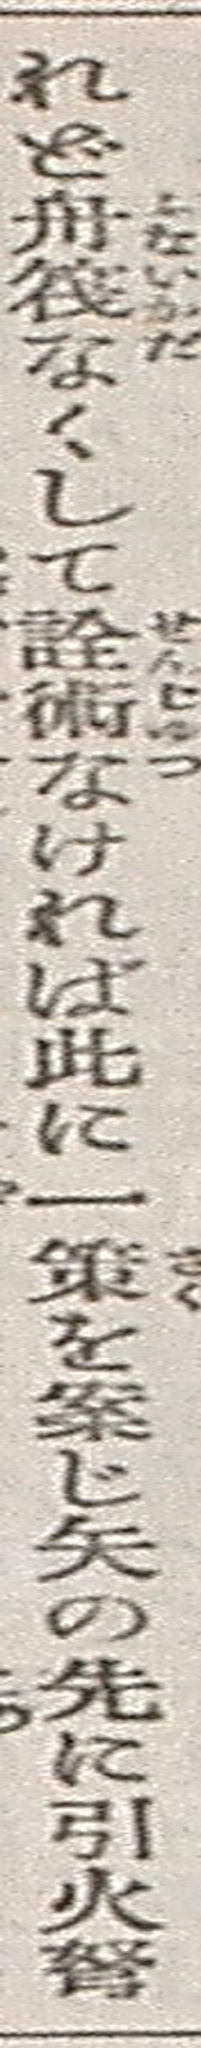れど舟筏なくして詮術なければ此に一策を案じ矢の先に引火弩
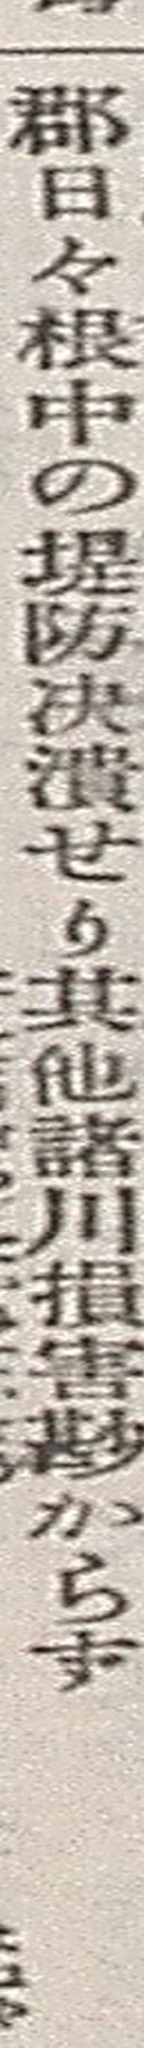郡日々根中の堤防决潰せり其他諸川損害尠からず
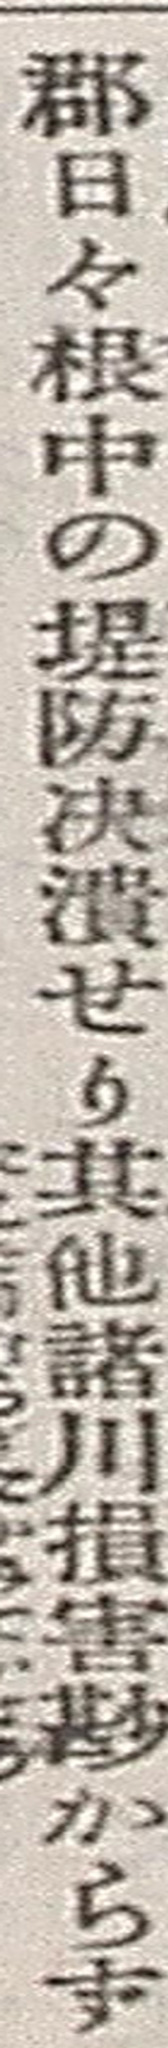郡日々根中の堤防决潰せり其他諸川損害尠からず
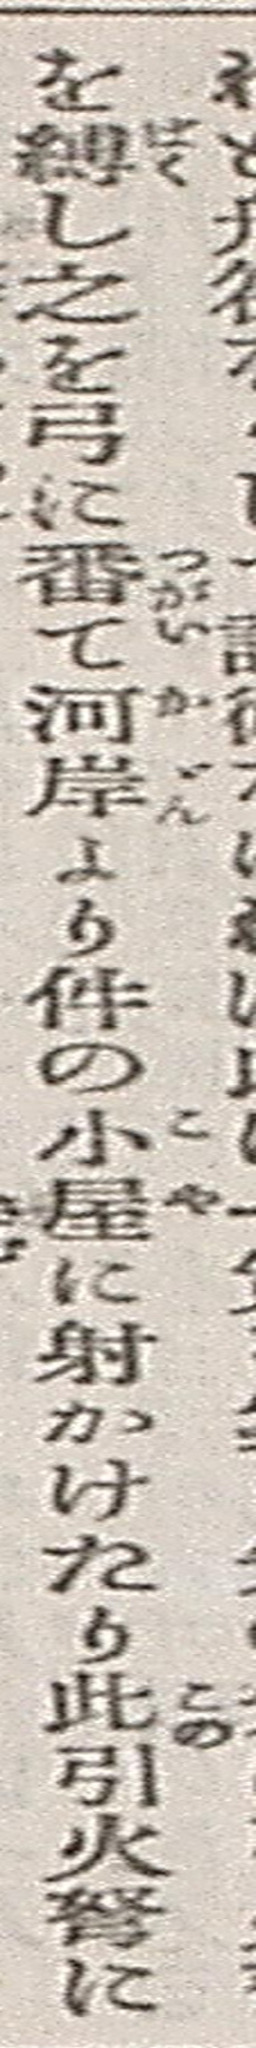を縛し之を弓に番て河岸より件の小屋に射かけたり此引火弩に
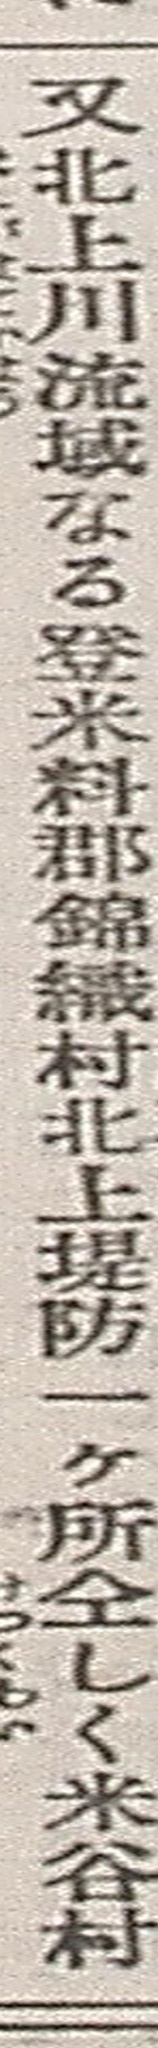又北上川流域なる登米料郡錦織村北上堤防一ヶ所同しく米谷村
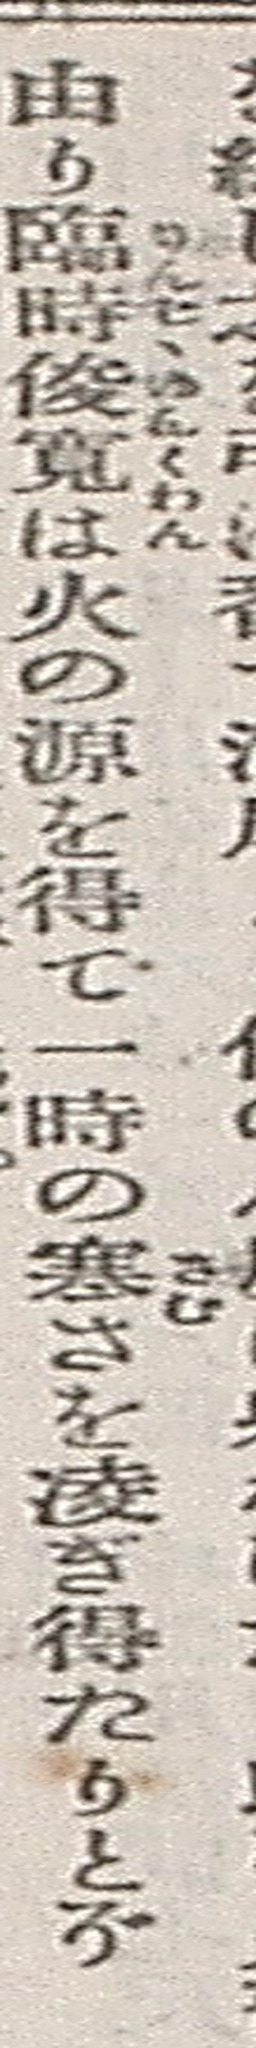由り臨時俊寛は火の源を得て一時の寒さを凌ぎ得たりとぞ
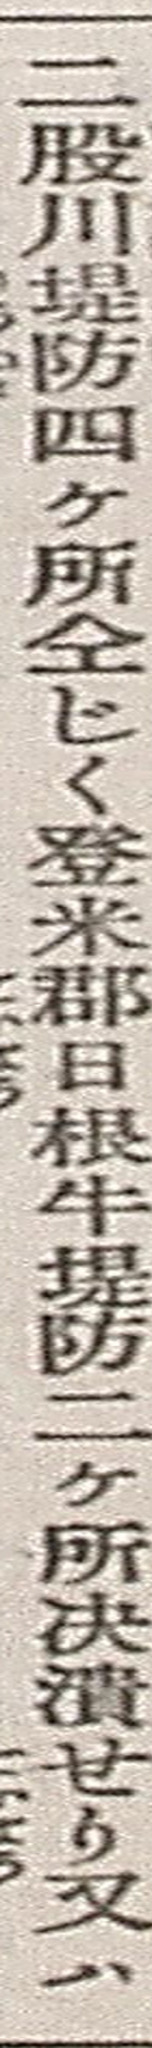二股川堤防四ヶ所同しく登米郡日根牛堤防二ヶ所决潰せり又ハ
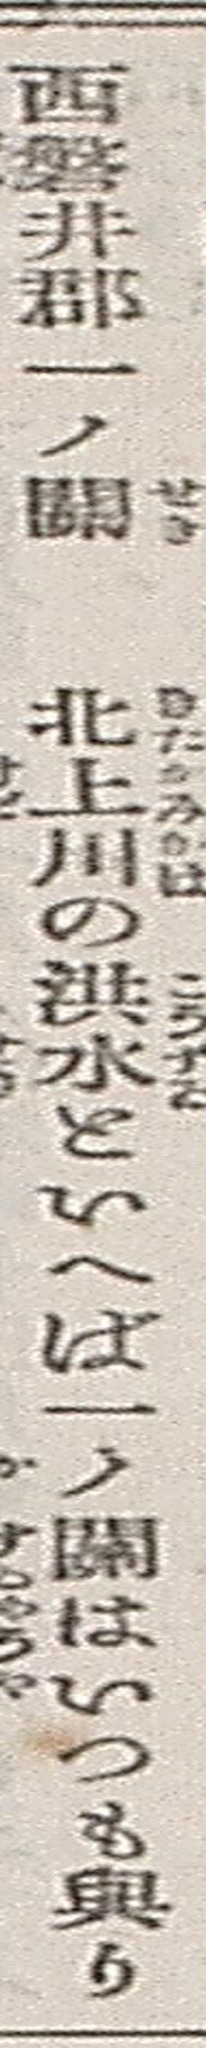西盤井郡一ノ関北上川の洪水といへば一ノ関はいつも輿り
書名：風俗畫報臨時増刊第百二十八號　洪水被害録（下）
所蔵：東京大学地震研究所図書室 Earthquake Research Institute Library, The University of Tokyo, JAPAN
